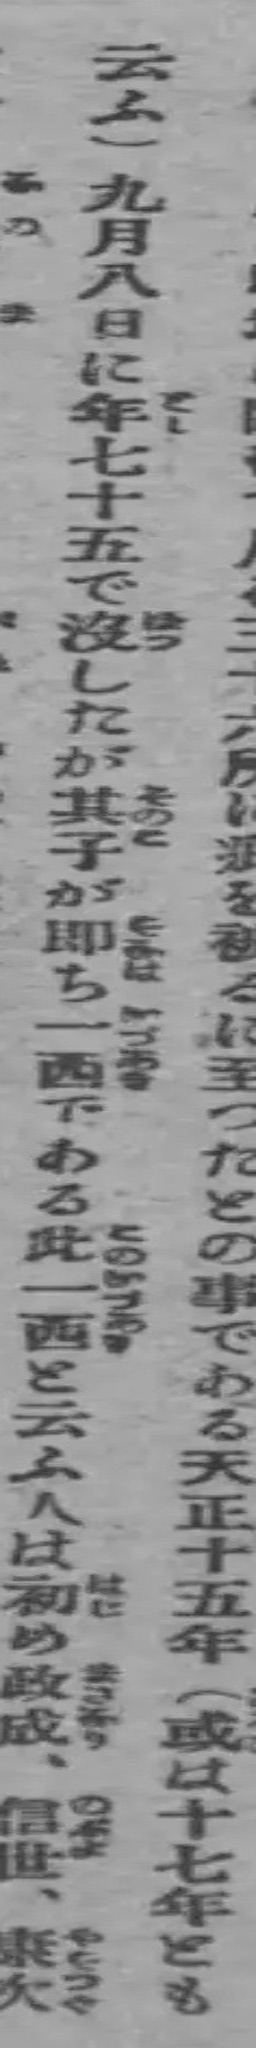戸田一西云ふ)九月八日に年七十五で没したが其子が即ち一西である此一西と云ふ人は初め政成、信世、康次
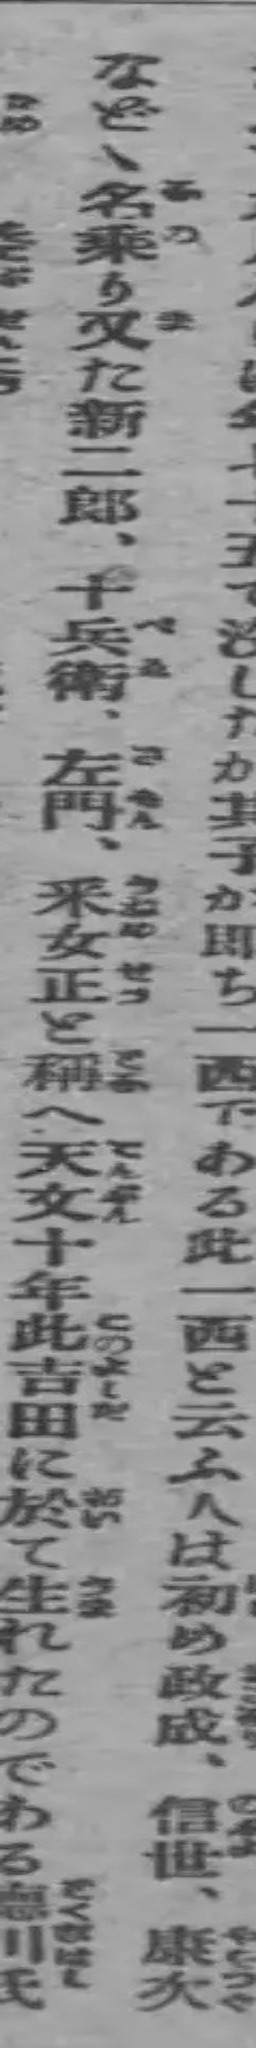などゝ名乗り又た新二郎、十兵衛、左門、采女正と称へ天文十年此吉田に於て生れたのである徳川氏
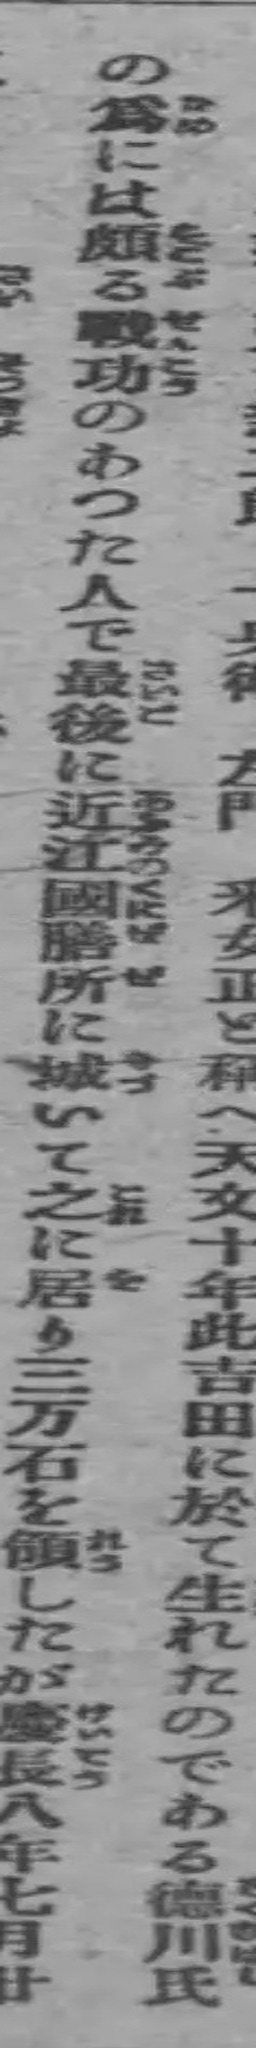の為には頗る戦功のあつた人で最後に近江国膳所に城いて之に居り三万石を領したが慶長八年七月廿
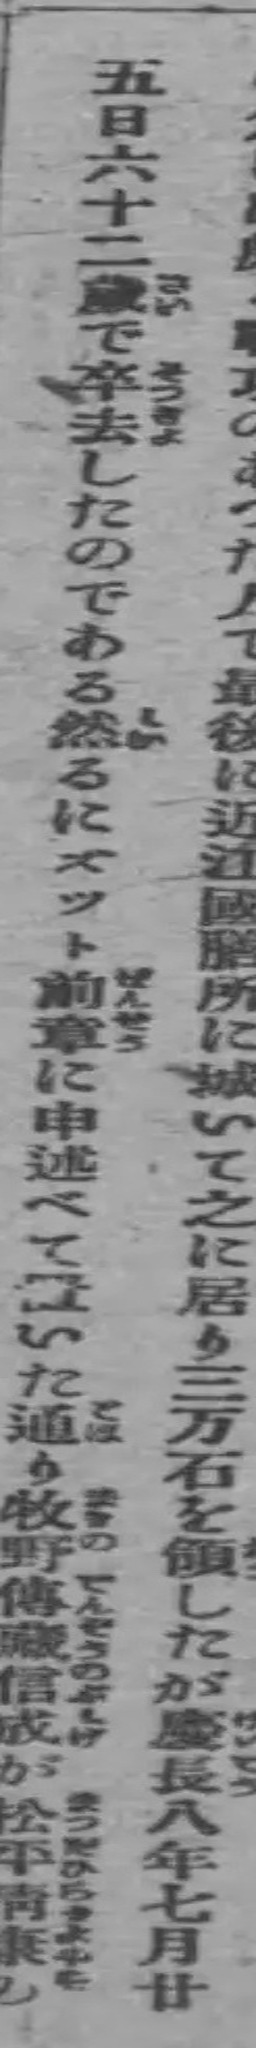五日六十二歳で卒去したのである然るにズツト前章に申述べて置いた通り牧野傳蔵信成が松平清康の
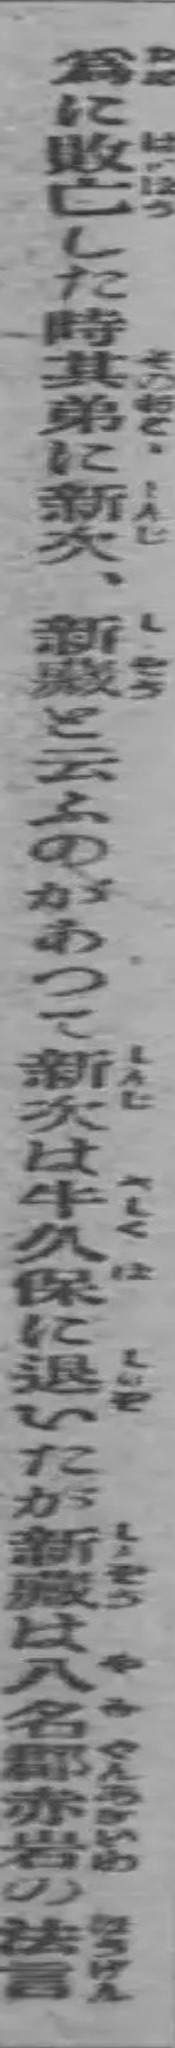為に敗亡した時其弟に新次、新蔵と云ふのがあつて新次は牛久保に退いたが新蔵は八名郡赤岩の法言
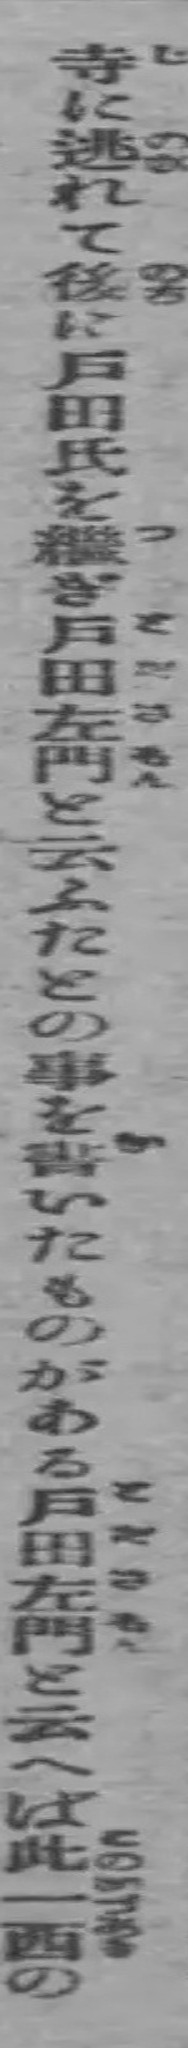寺に逃れて後に戸田氏を継ぎ戸田左門と云ふたとの事を書いたものがある戸田左門と云へば此一西の
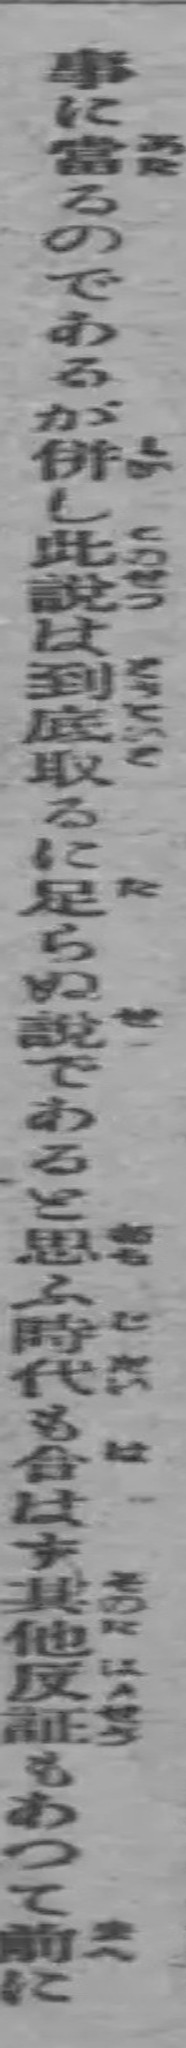事に当るのであるが併し此説は到底取るに足らぬ説であると思ふ時代も合はず其他反証もあつて前に
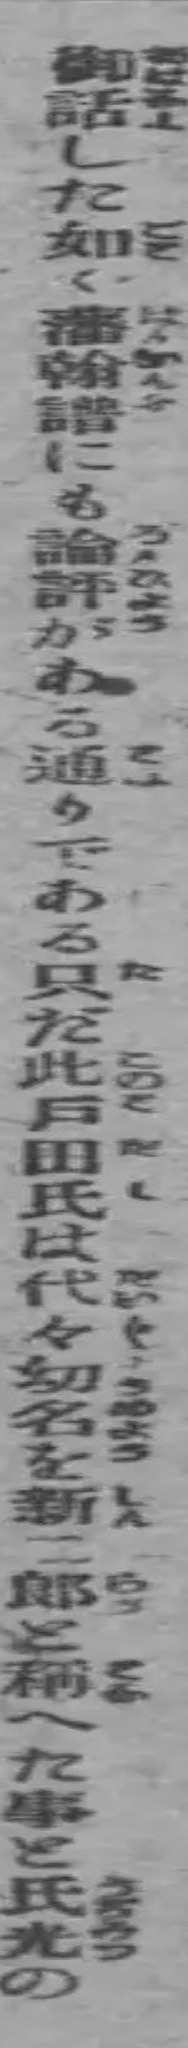牧新兵衛御話した如く藩翰譜にも論評がある通りである只だ此戸田氏は代々幼名を新二郎と称へた事と氏光の
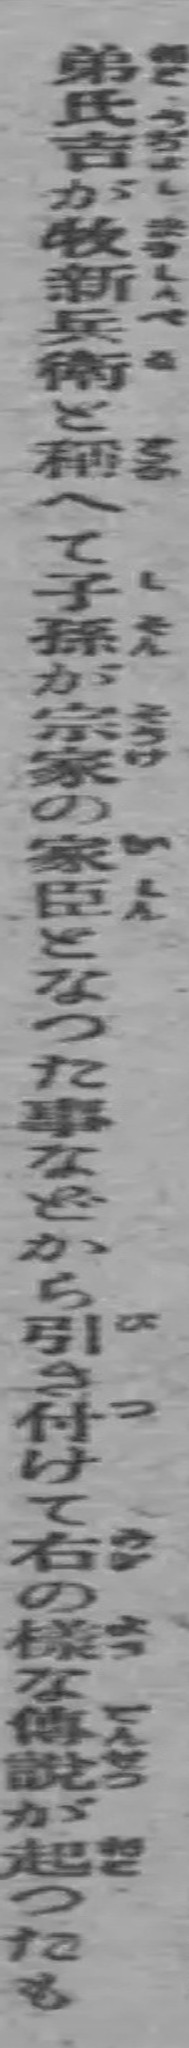弟氏好が牧新兵衛と称へて子孫が宗家の家臣となつた事などから引き付けて右の様な伝説が起つたも
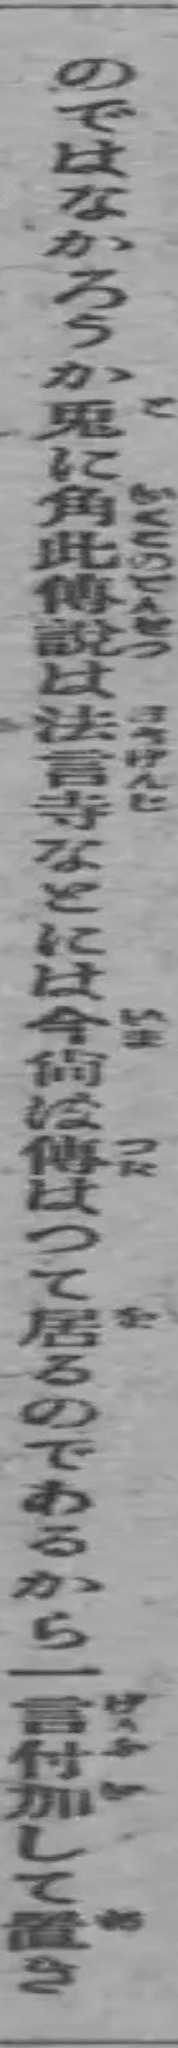のではなかろうか兎に角此伝説は法言寺なとには今尚ほ伝はつて居るのであるから一言付加して置き
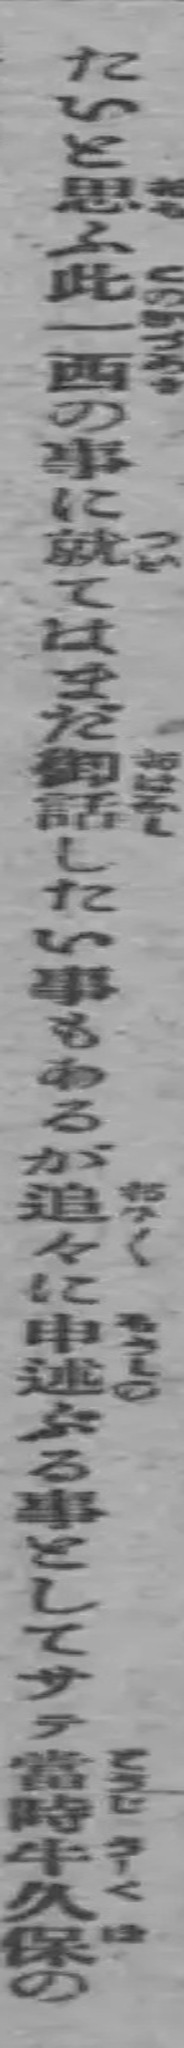たいと思ふ此一西の事に就てはまだ御話したい事もあるが追々に申述ぶる事としてサテ当時牛久保の
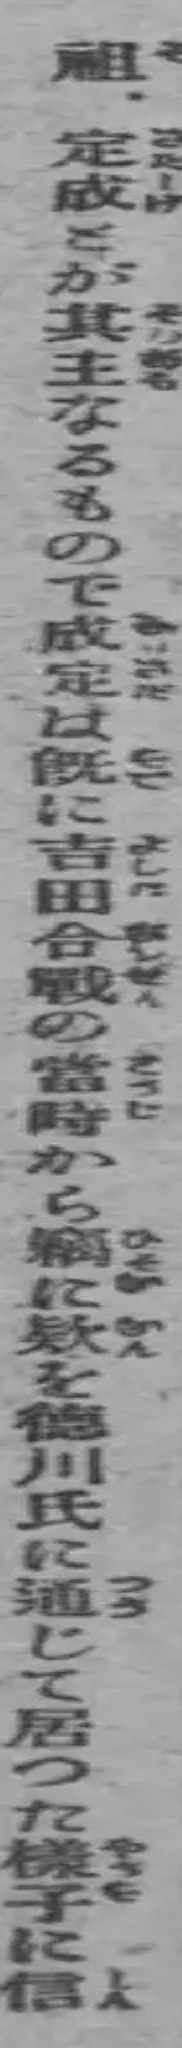祖、定成とが其主なるもので成定は既に吉田合戦の当時から竊に欵を徳川氏に通じて居つた様子に信
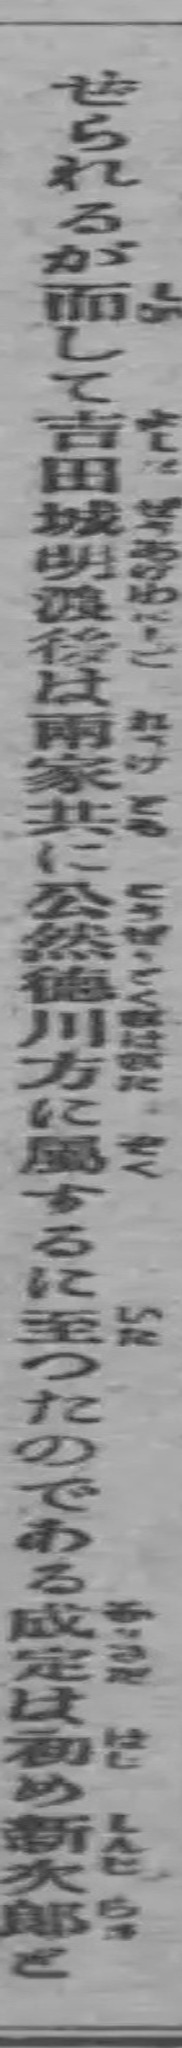ぜられるが而して吉田城明渡後は両家共に公然徳川方に属するに至つたのである成定は初め新次郎と
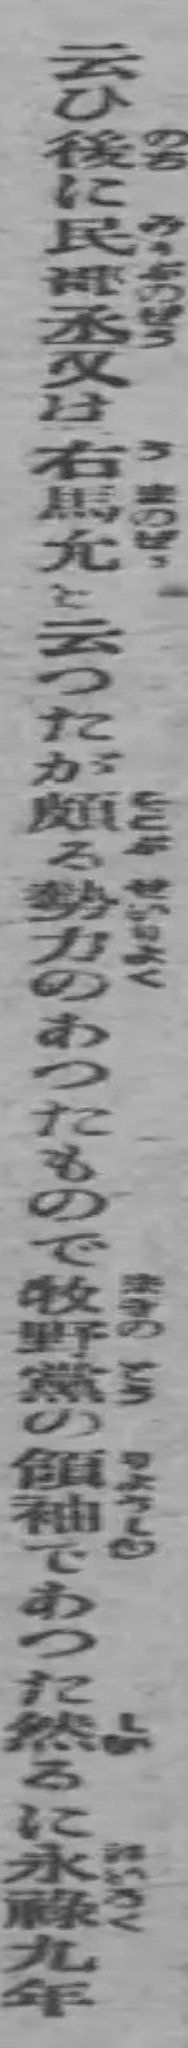云ひ後に民部丞又は右馬允と云つたが頗る勢力のあつたもので牧野党の領袖であつた然るに永禄九年
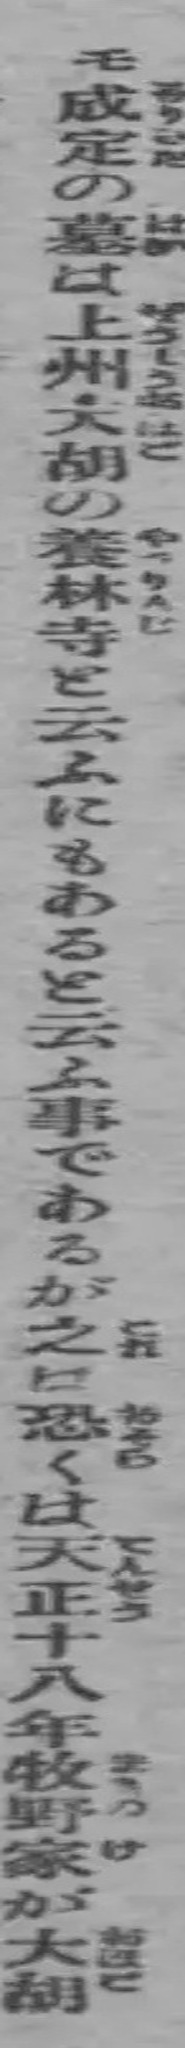モ成定の墓は上州大胡の養林寺と云ふにもあると云ふ事であるが之は恐くは天正十八年牧野家が大胡
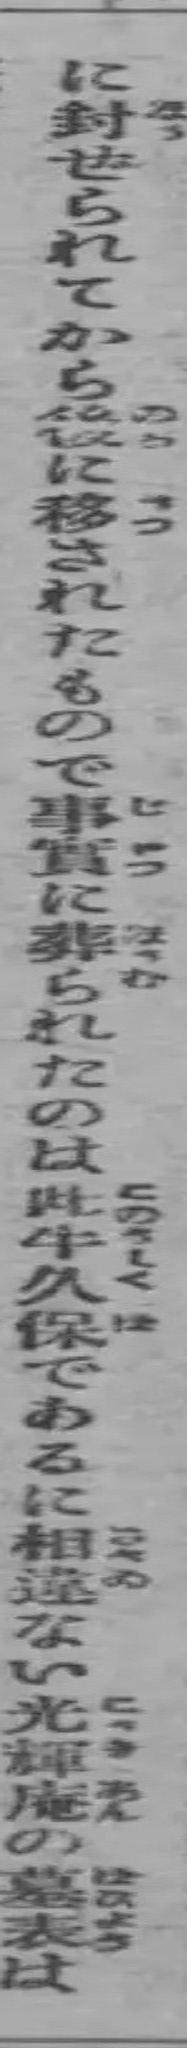に封ぜられてから後に移されたもので事実に葬られたのは此牛久保であるに相違ない光輝庵の墓表は
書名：豊橋市史談
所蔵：国立国会図書館 National Diet Library, JAPAN
